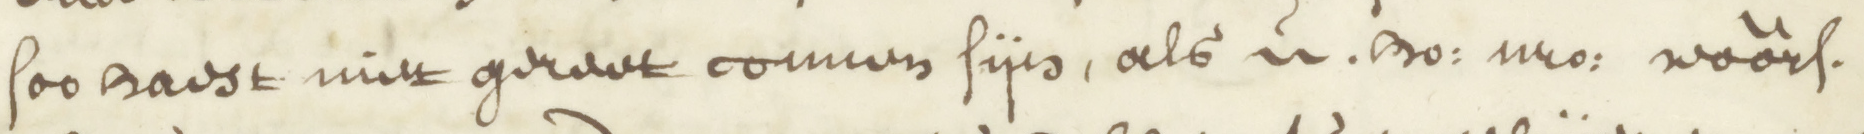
soo haest niet gereet connen sijn, als U. Ho:Mo: voors.
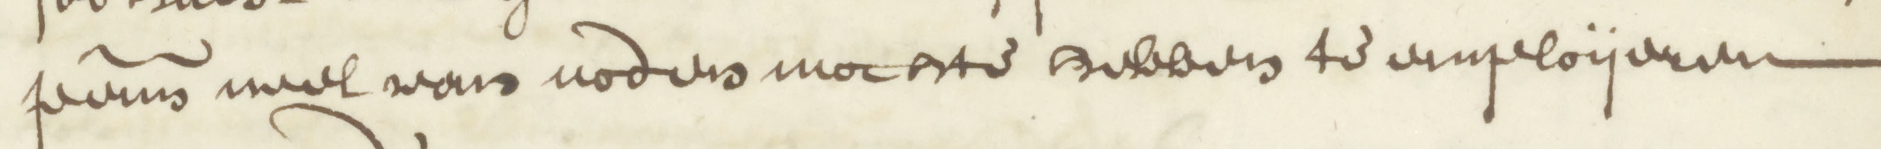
penn wel van noden mochten hebben te emploijeren:
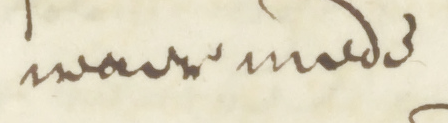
waer mede.
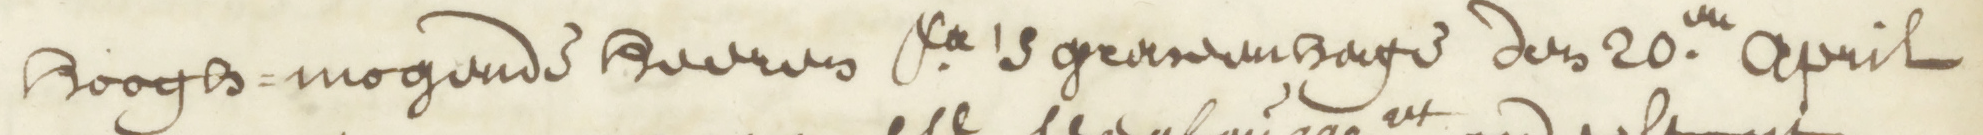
Hoogh=mogende Heeren ? 's gravenhage den 20en april
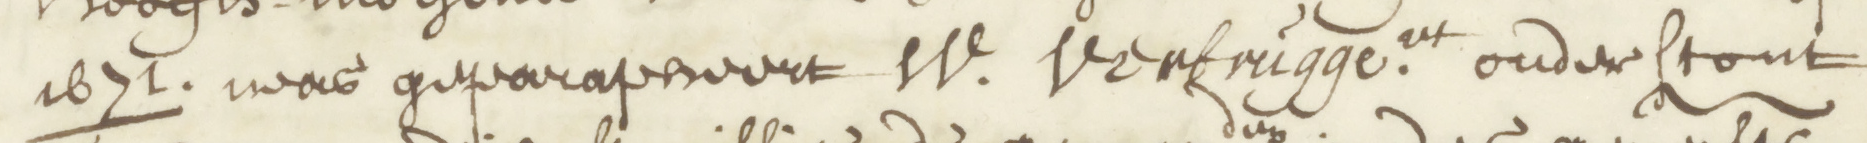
1671. was geparapheert W. Verbrugge onder stont
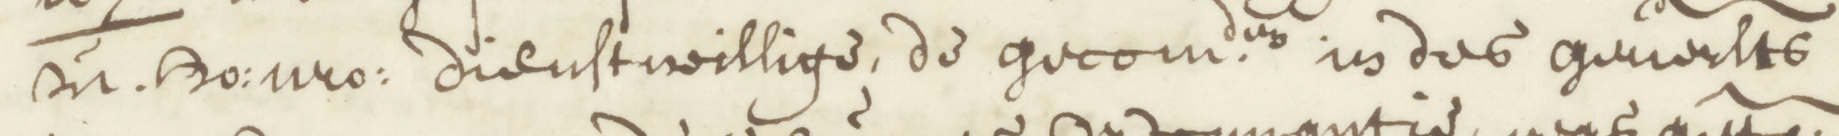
U. Ho:Mo: dienstwillige, de gecomden. in des generalts
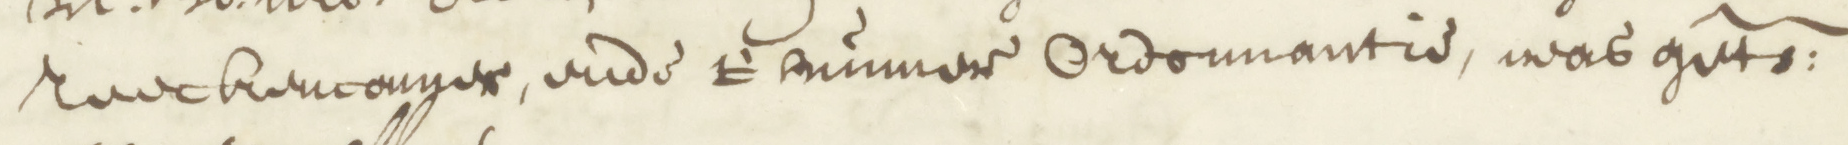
reeckencamer, ende t' hunner Ordonnantie. Was get:
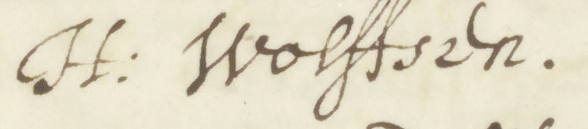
H. Wolffsen.
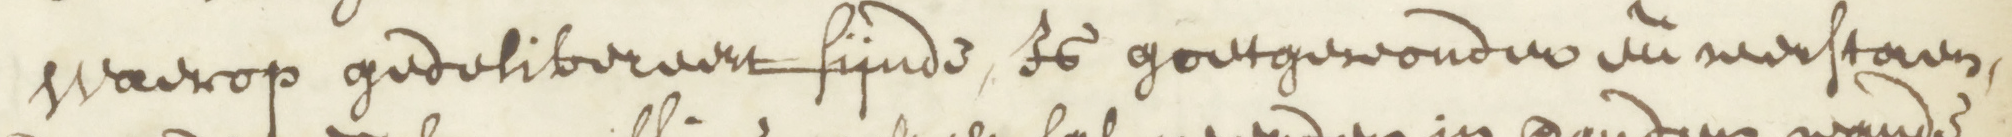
Waerop gedelibereert sijnde, Is goetgevonden en verstaen
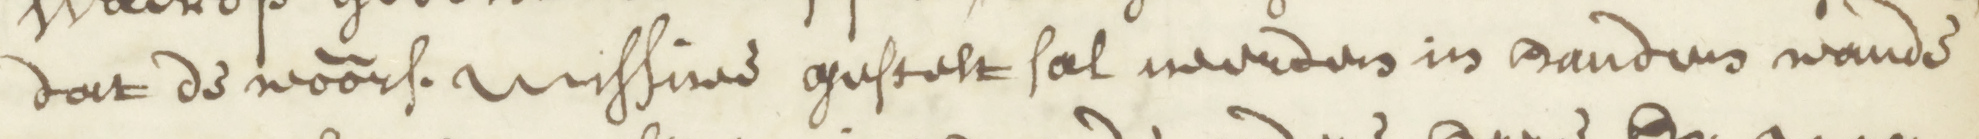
dat de voors. missive gestelt sal werden in handen vande
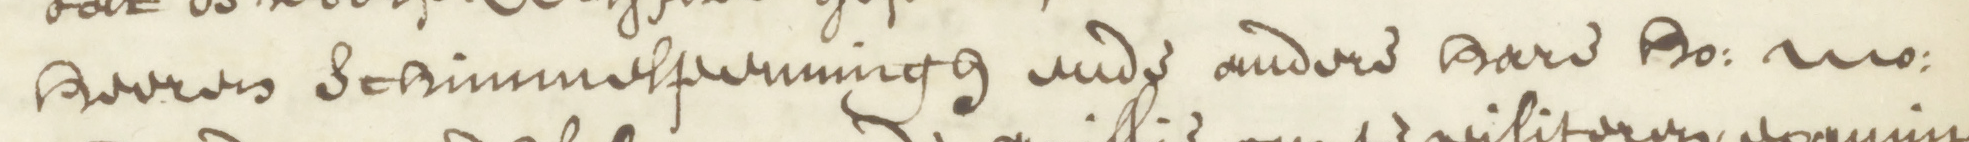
heeren Schimmelpenningh ende andere hare Ho:Mo:
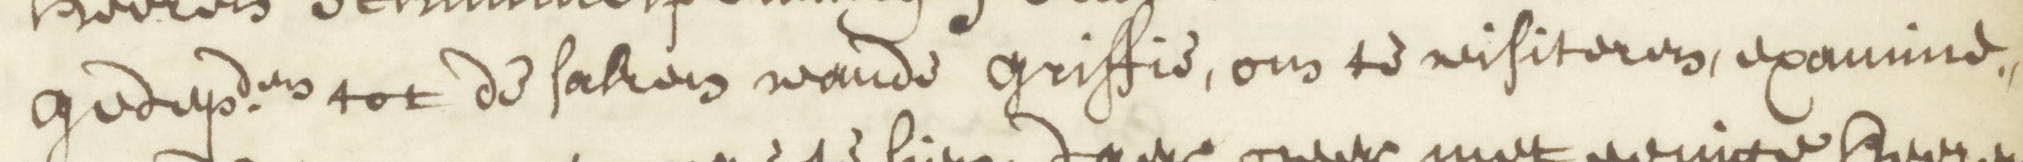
gedepden. tot de saken van de griffie, om te visiteren, examine„
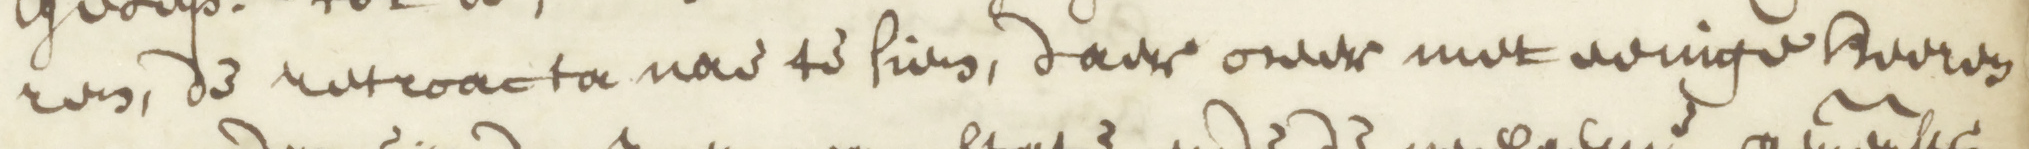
ren, de retroacta nae te sien, daer over met eenige heeren
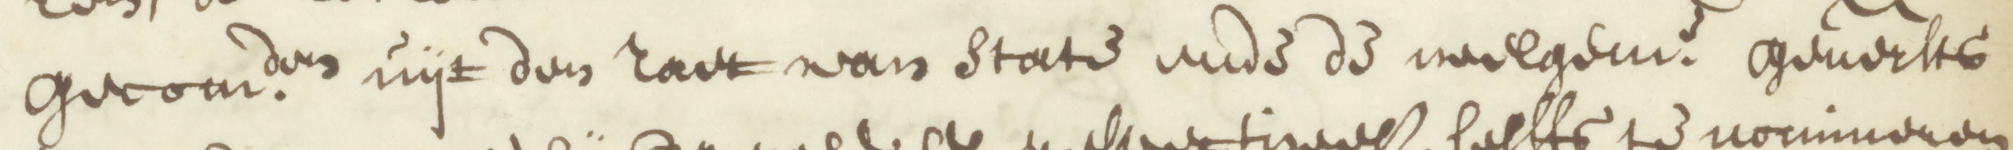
gecomden. uijt den raet van State ende de welgeme. generalts
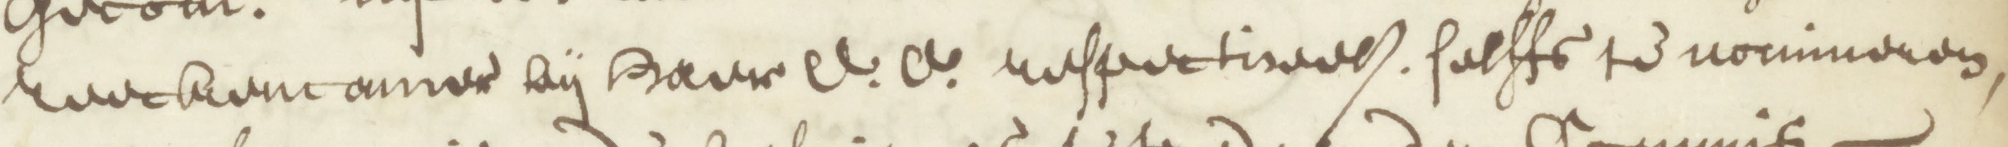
reeckencamer bij haer E.E. respectivel. selffs te nomineren
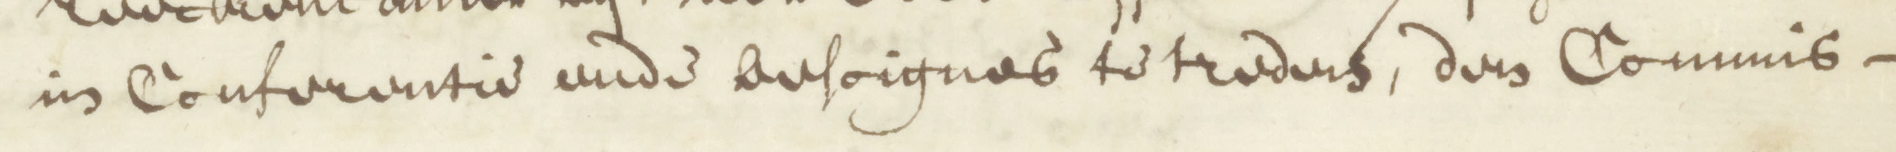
in Conferentie ende besoignes te treden den Commis —
